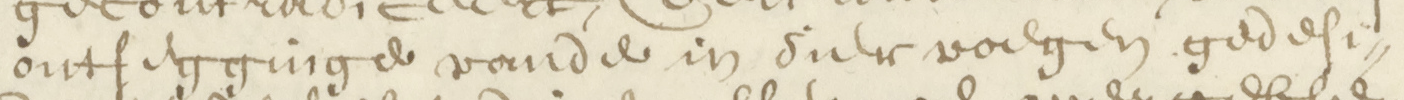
ontsegginge vande in dier voegen gedesi„
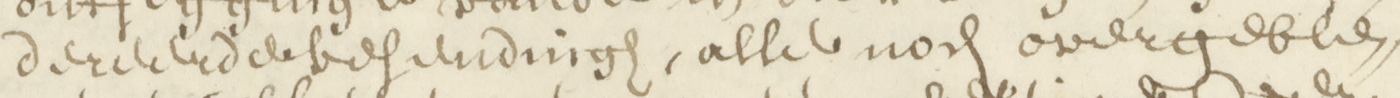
dereerde besendingh, alle noch overgeble„
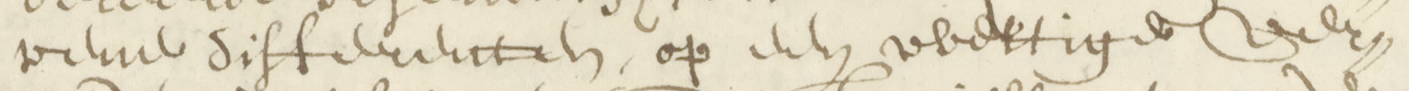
vene differenten, op een wettige ver,,
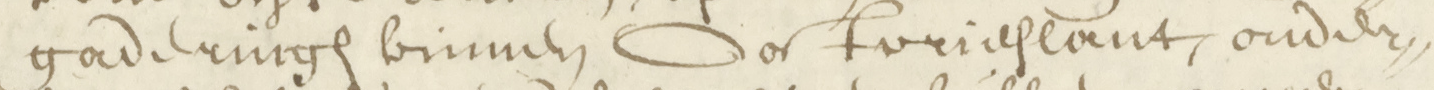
gaderingh binnen Oostvrieslant, onder„
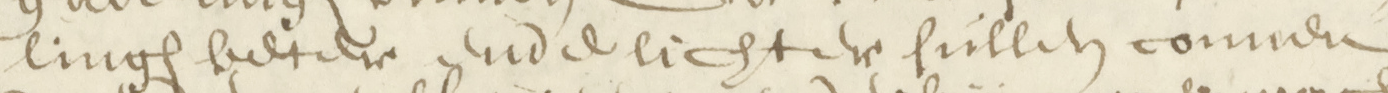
lingh beter ende lichter sullen connen
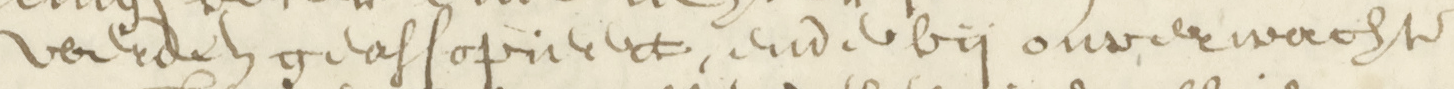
werden geassopieert ende bij onverwachte
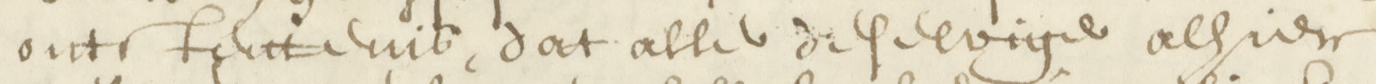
ontstentenis, dat alle deselvige alhier
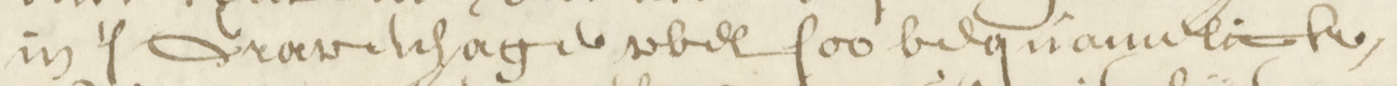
in 's Gravenhage wel soo bequamelick,
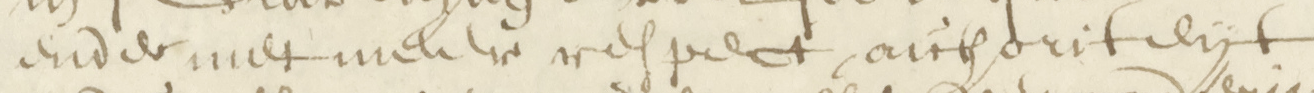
ende met meer respect, authoriteijt
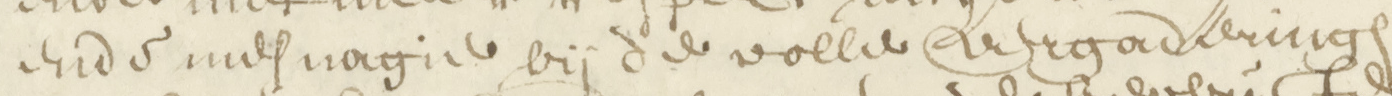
ende mesnagie bij de volle vergaderingh
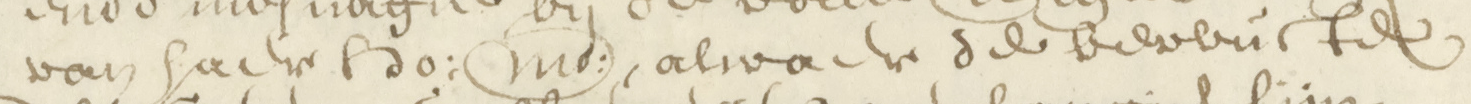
van haer Ho:Mo:, alwaer de bewuste
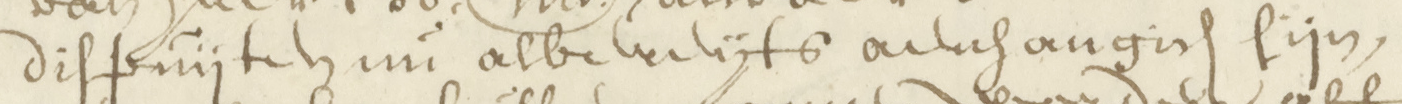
dispuijten nu albereijts aenhangich sijn,
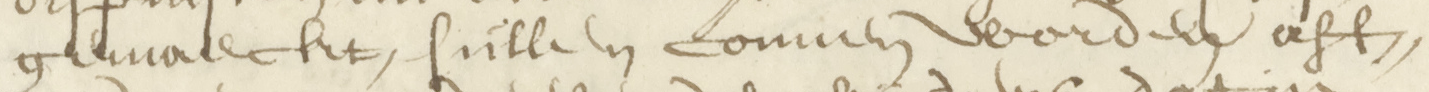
gemaeckt, sullen connen worden aff„
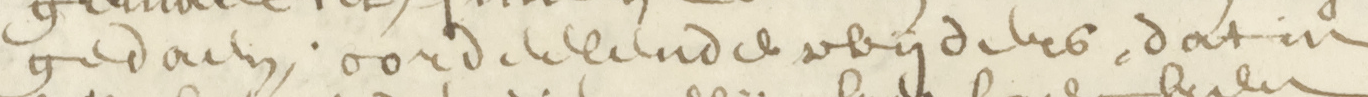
gedaen, oordeelende wijders, dat in
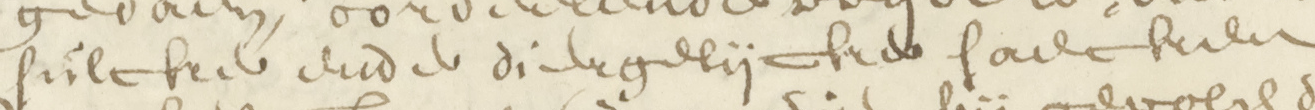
sulcke ende diergelijcke saecken
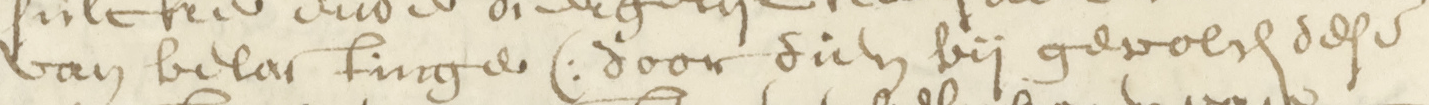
van belastinge (: door dien bij gevolch dese
